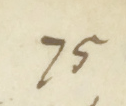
75
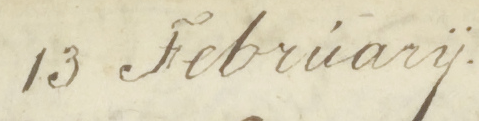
13 Februari
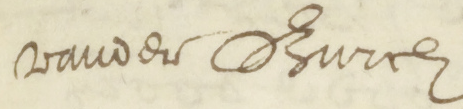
vander Burch
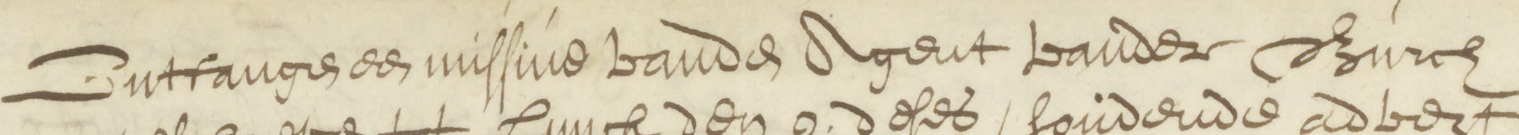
Ontfangen een missiue vanden Agent vander Burch
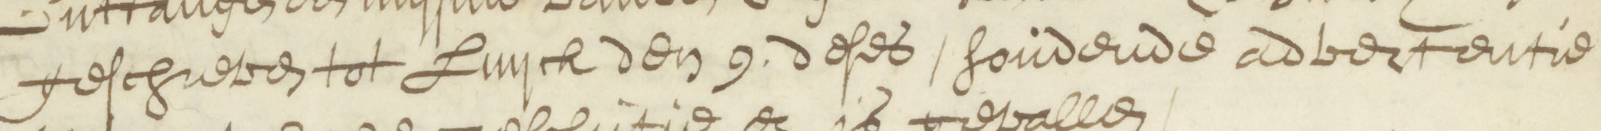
geschreven tot Luyck den 9. deses, houdende advertentie
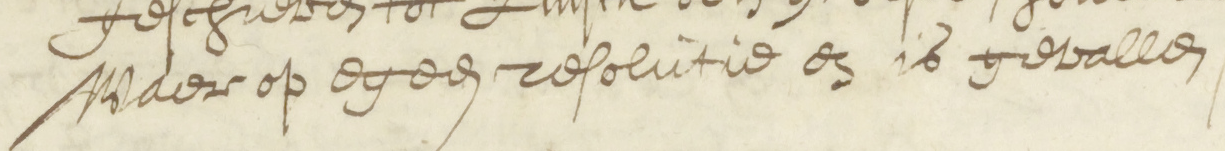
Waer op egeen resolutie en is gevallen.
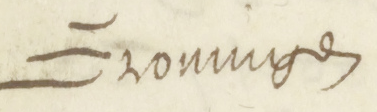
Gronningen
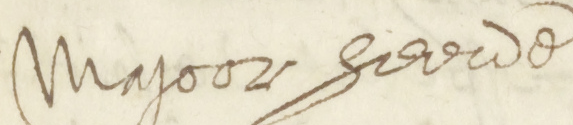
Majoor heerde
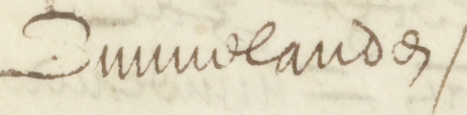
Ommelanden.
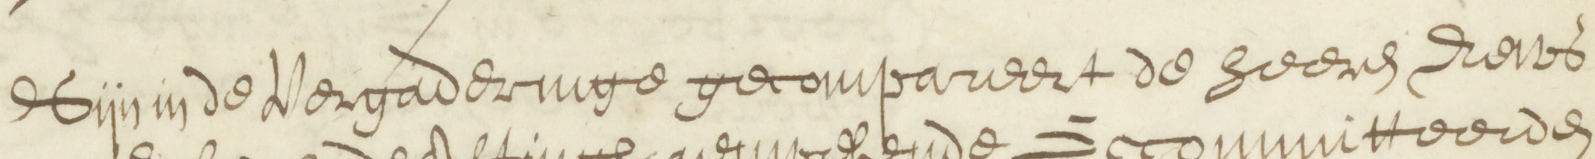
Sijn in de Vergaderinge gecompareert de heeren Drews
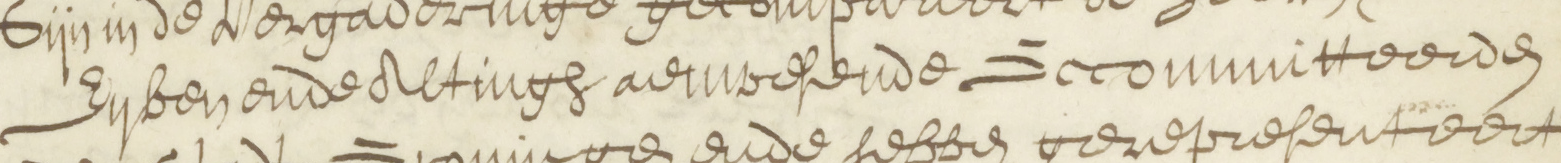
Eyben ende Altingh aenwesende Gccommitteerden
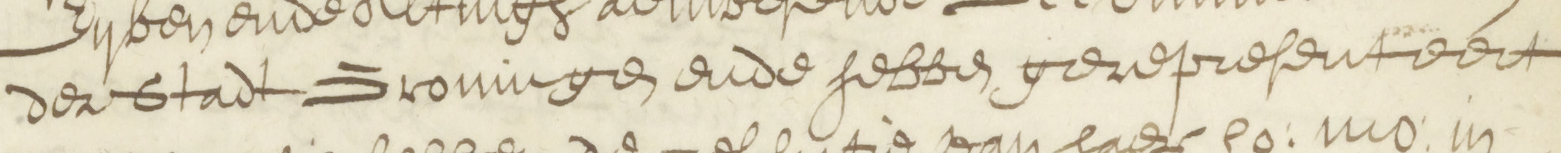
der stadt Groningen ende hebben gerepresenteert
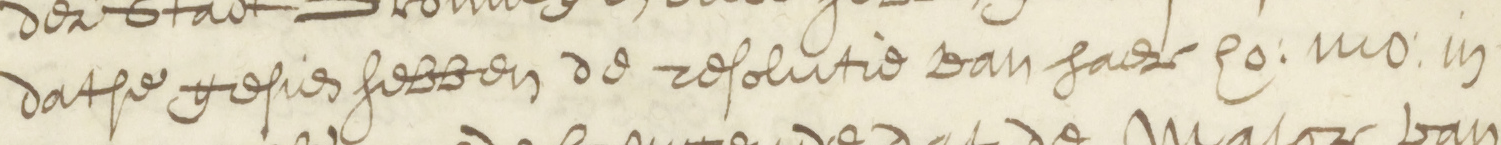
datse gesien hebben de resolutie van haer ho:mo: in
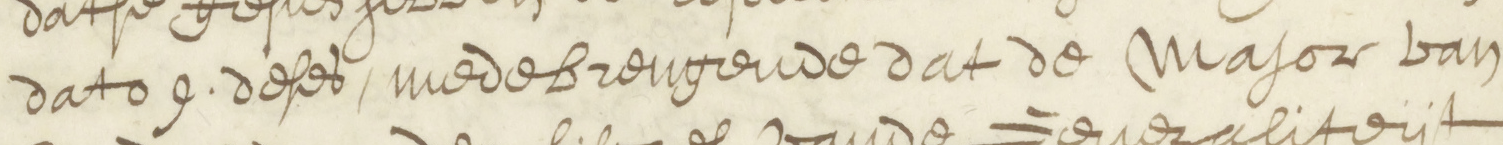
dato 9. deses, medebrengende dat de Major van
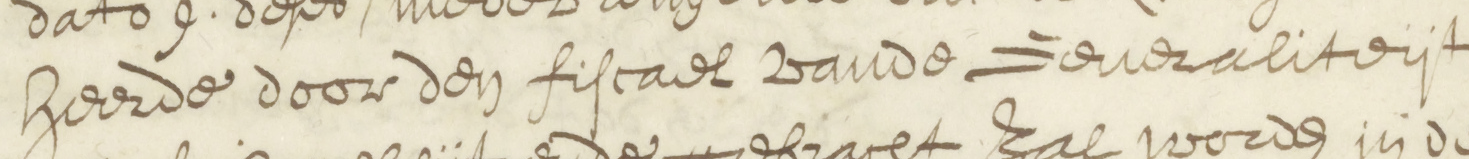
heerde door den fiscael vande Generaliteijt
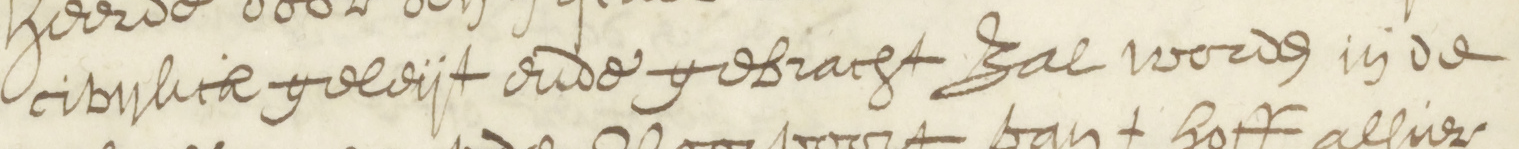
cvylick geleijt ende gebracht zal worden in de
